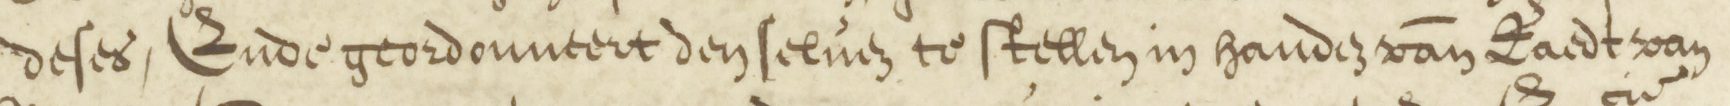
deses. Ende geordonneert denseluen te stellen in handen van Raedt van
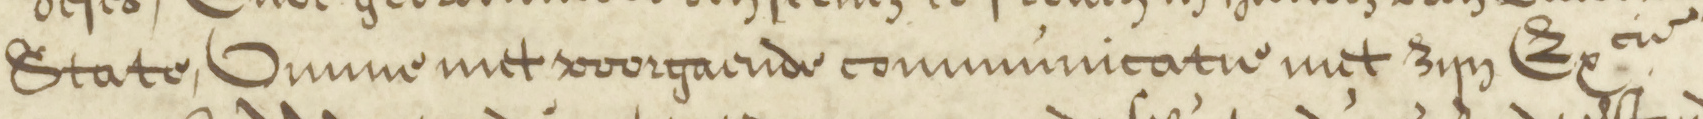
State, Omme met voorgaende communicatie met zyn Excie.
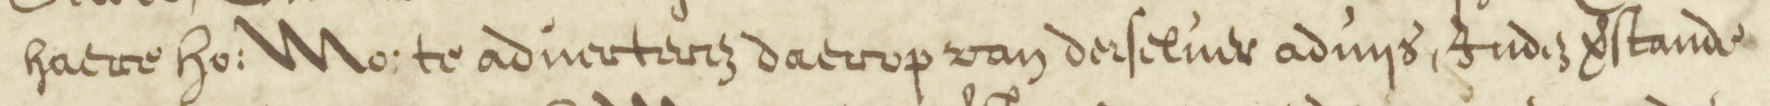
haere ho:Mo: te aduerteren daerop van derseluer aduys, inden vstande
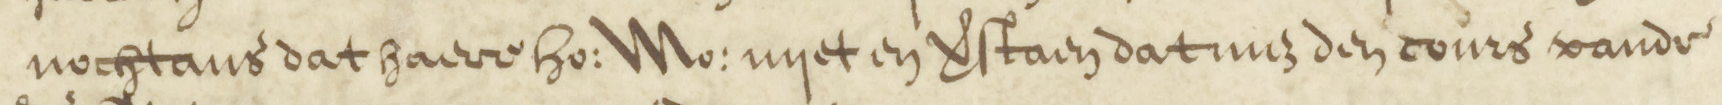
nochtans dat haere ho:Mo: nyet en vstaen datmen den cours vande
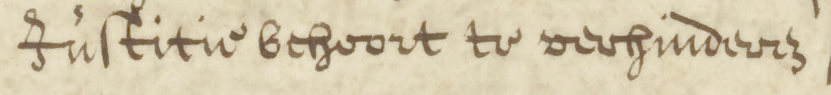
Justitie behoort te verhinderen.
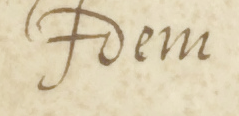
Idem
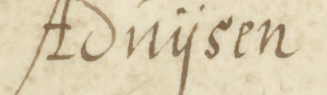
Aduijsen
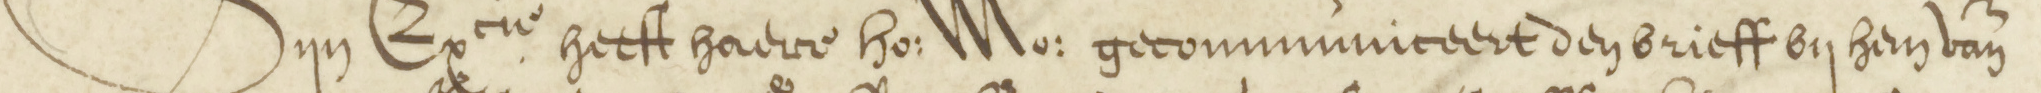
Syn Excie. heeft haere ho:Mo: gecommuniceert den brieff by hem van
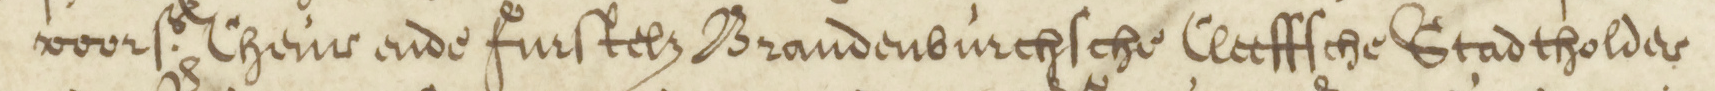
voors. Cheur ende Furstel Brandenburchsche Cleeffsche Stadtholder
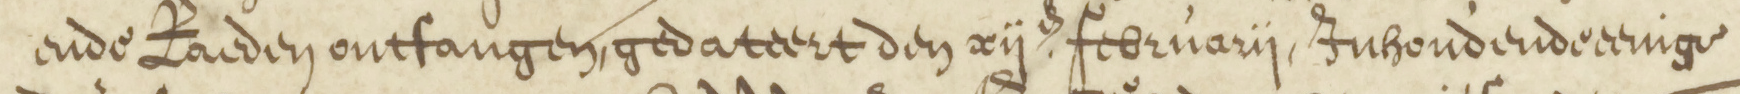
ende Raeden ontfangen, gedateert den xijen Februarij, Inhoudende eenige
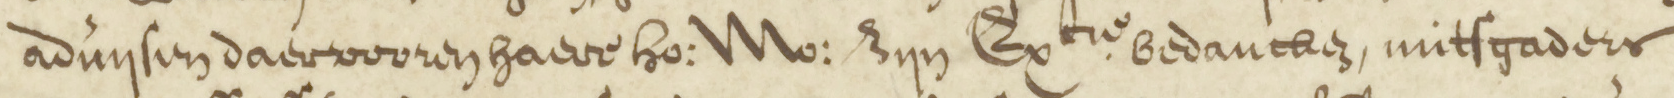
aduysen daervooren haere ho:Mo: Zyn Excie. bedancken, mitsgaders
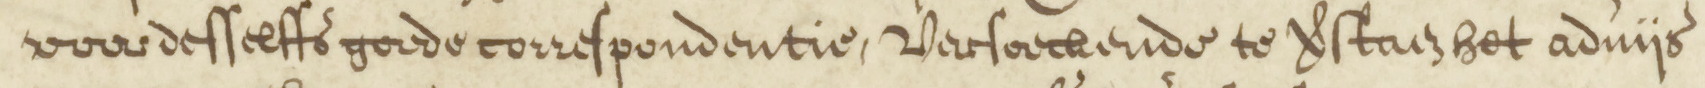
voor desselffs goede correspondentie, Versoeckende te vstaen het aduijs
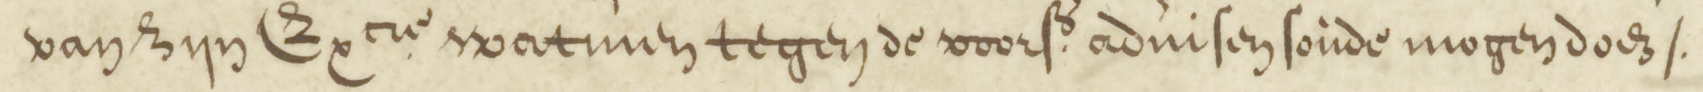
van Zyn Excie. wat men tegen de voors aduisen soude mogen doen.
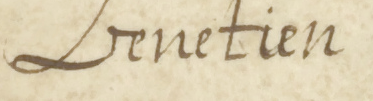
Venetien
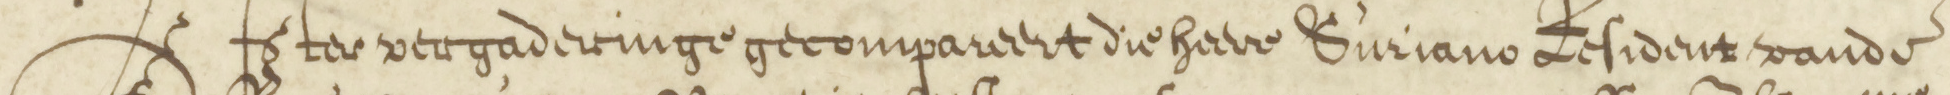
Is ter vergaderinge gecompareert die heere Suriano Resident vande
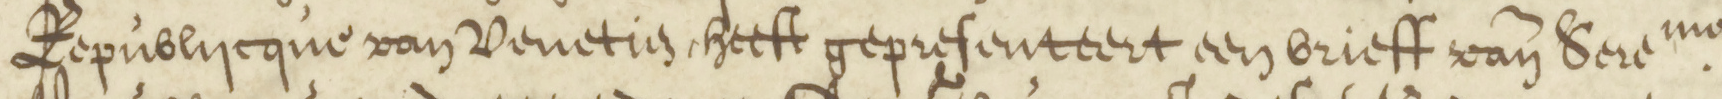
Republycque van Venetien, heeft gepresenteert een brieff van Sereme.
